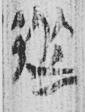從
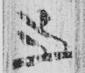之
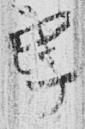好
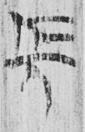長
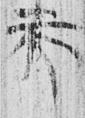天
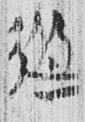從
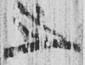之
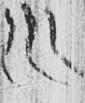川（順）
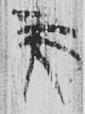天
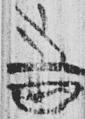之日
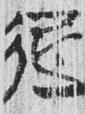○（起）
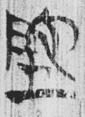地
